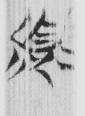寡
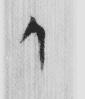人
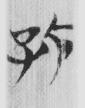孤
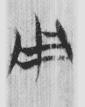用
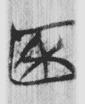{匚禾}
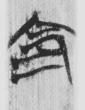命
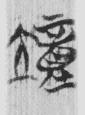{立童}
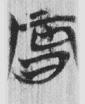晨
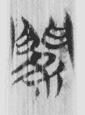{門豕}
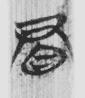冒
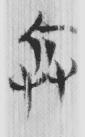兵
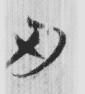刃
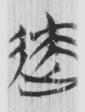{辶夫}
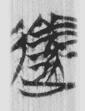{辶𤰇}
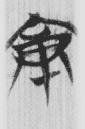{亯京}
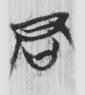君
